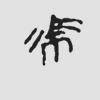{來巿}
